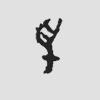色
